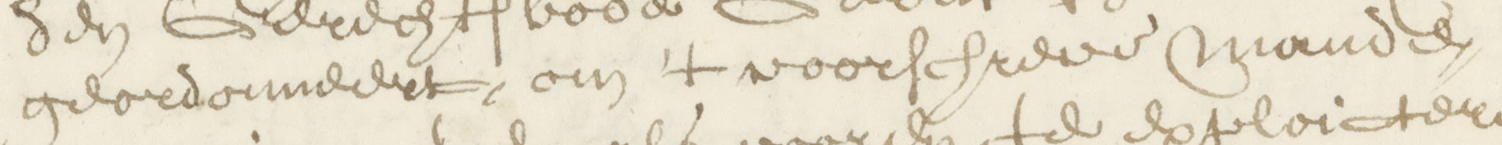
geordonneert, om 't voorschreve mande„
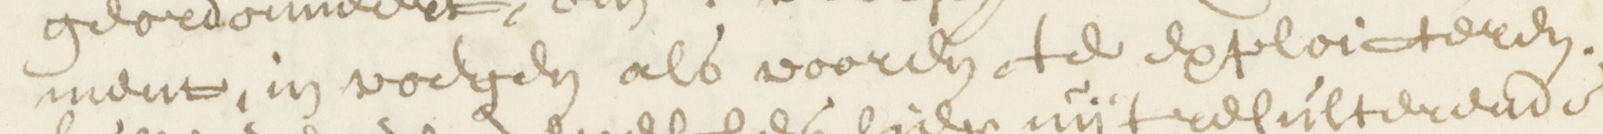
ment, in voegen als vooren te exploicteren.
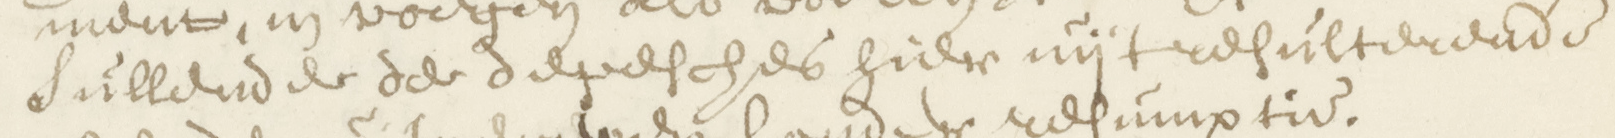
sullende de depesches hier uijtresulterende
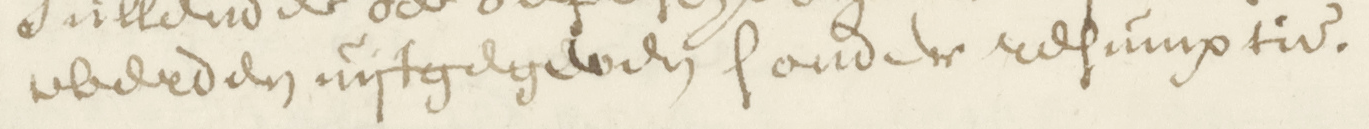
werden uijtgegeven sonder resumptie.
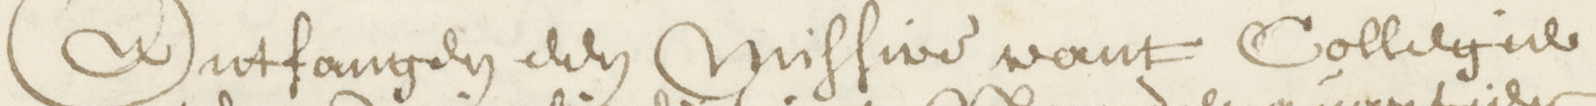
Ontfangen een missive vant Collegie
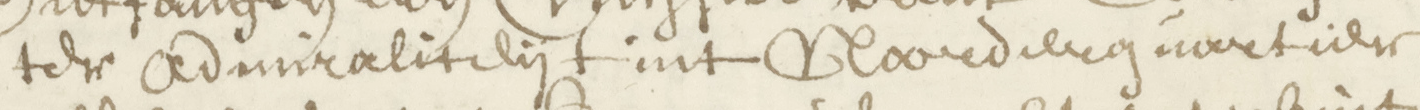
ter Admiraliteijt int Noorderquartier
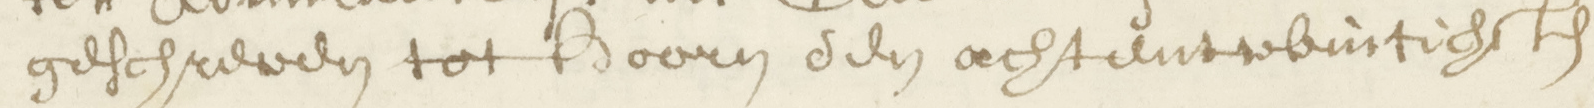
geschreven tot Hoorn den achtentwintichsten
